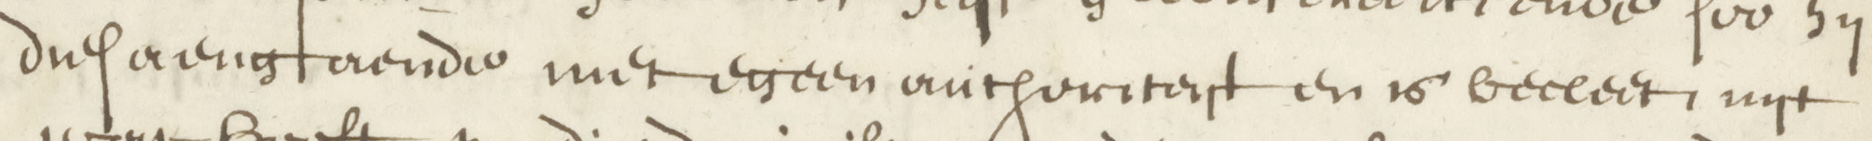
diesaengaende met egeen autheriteyt en is becleet, uyt
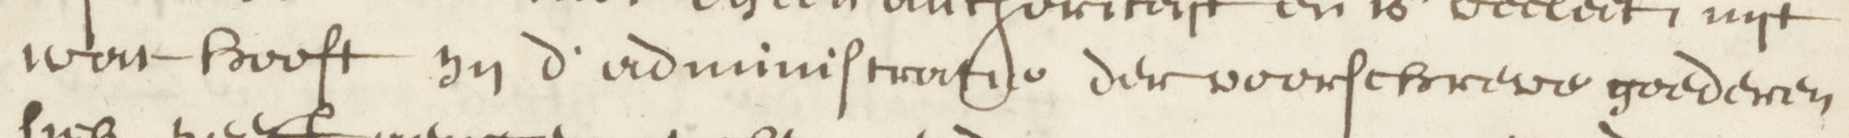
wat hooft hy d‛administratde der voorschreve goederen
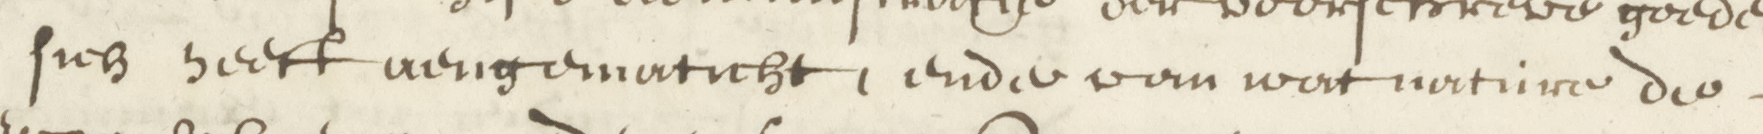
sich heeft aengematicht, ende van wat nature de
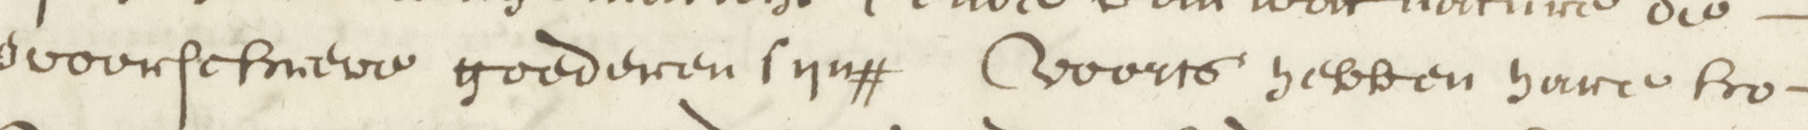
voorschreve goederen sijn# Voorts hebben hare ho:
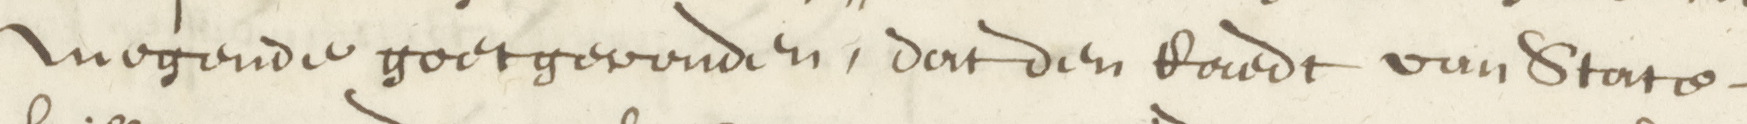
mogende goetgevonden, dat den Raedt van State
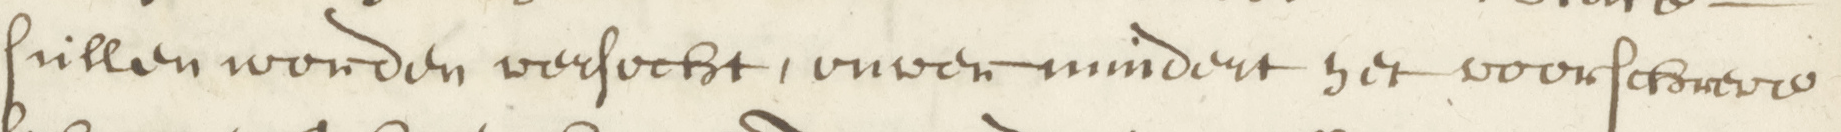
sullen worden versocht, onvermindert het voorschreve
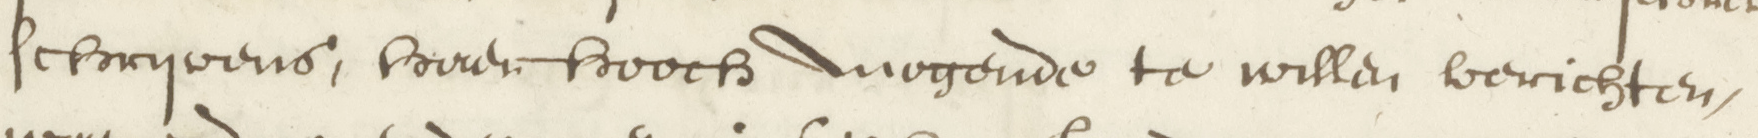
schryvens, haer hooch mogende te willen berichten,
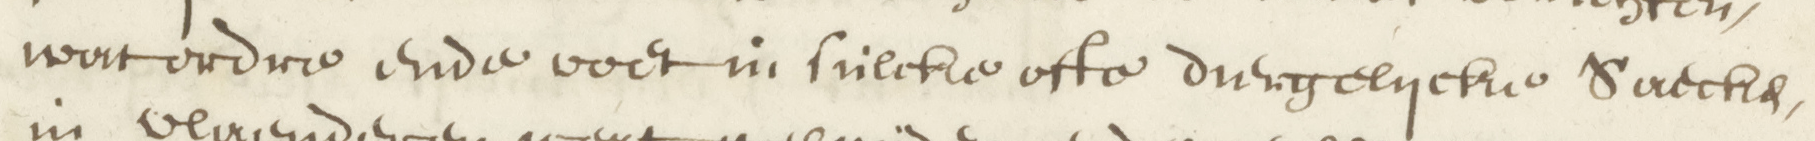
wat ordre ende voet in sulcke ofte diergelycke saecken,
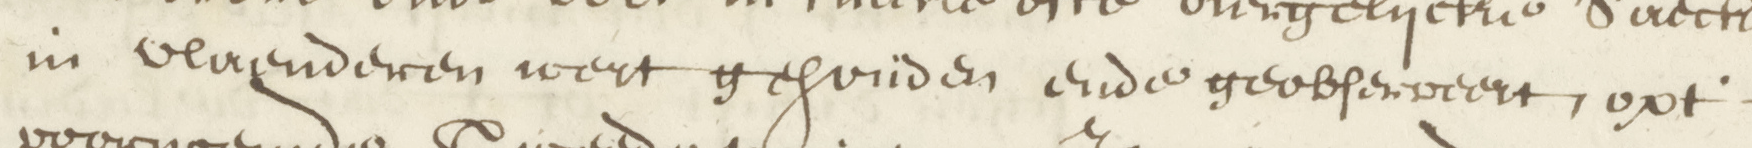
in Vlaenderen wert gehouden ende geobserveert, opt'
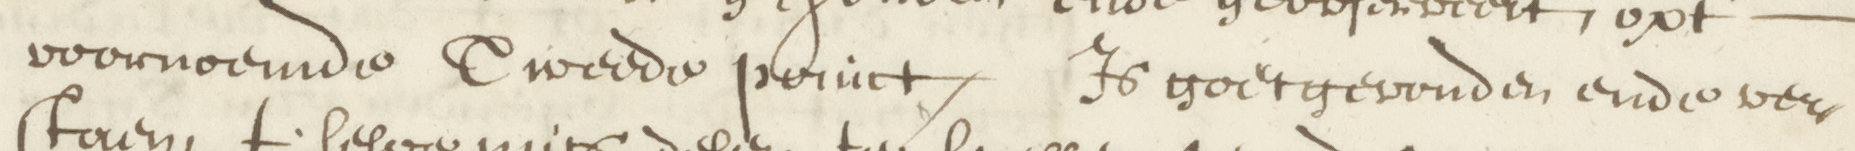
voornoemde Tweede poinct, is goetgevonden ende ver„
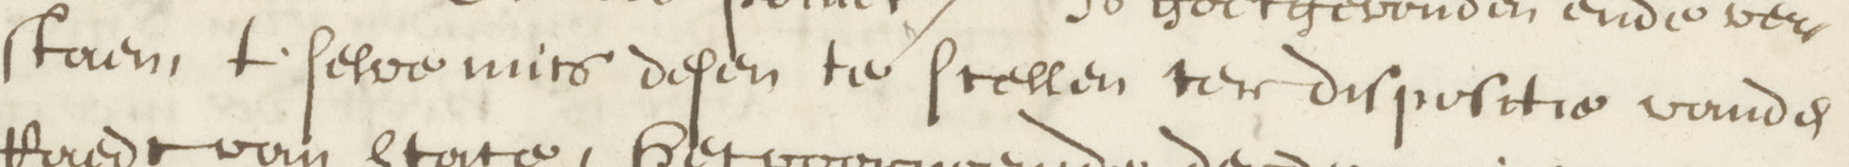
staen, t' selve mits desen te stellen ter dispositie vanden
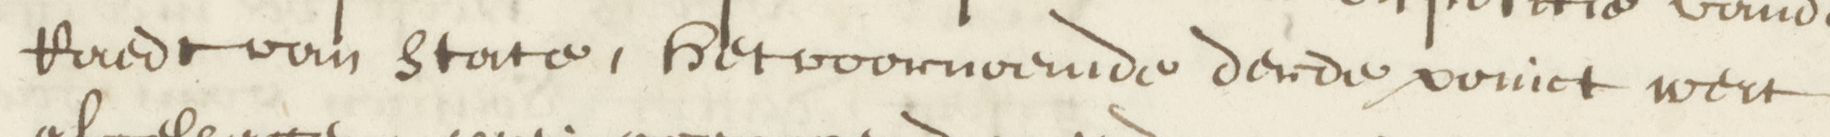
Raedt van State, het voornoemde derde poinct wert
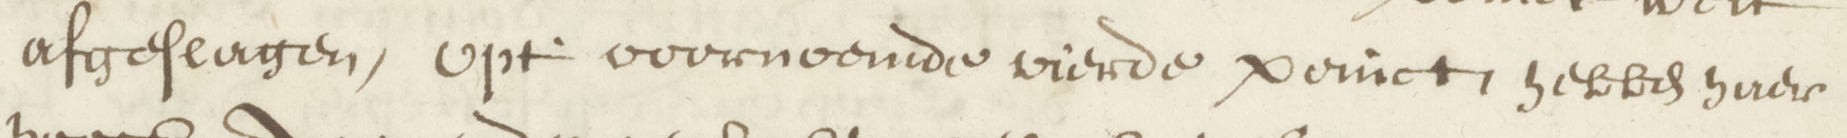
afgeslagen. Opt' voornoemde vierde poinct, hebben haer
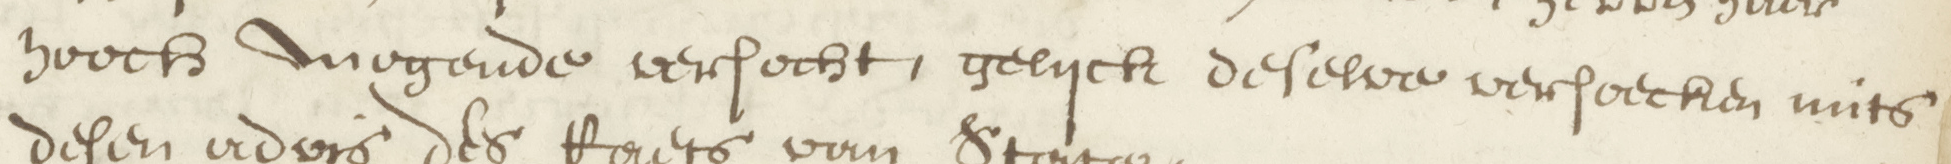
hooch mogende versocht, gelyck deselve versoecken mits
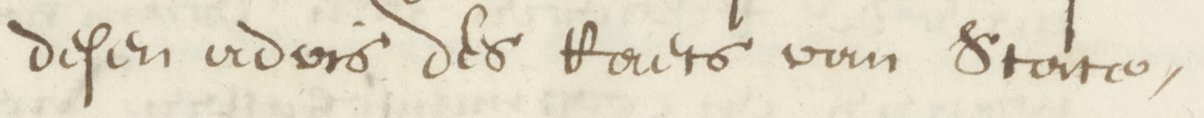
desen advis des Raets van State.
